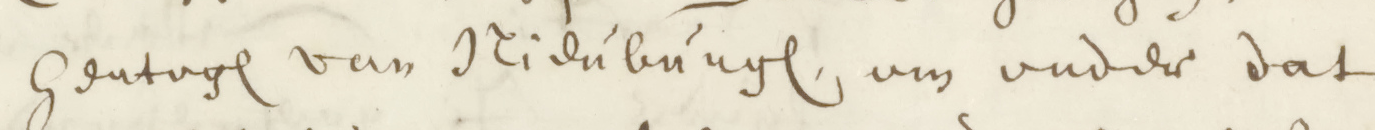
hertogh van Nieuburgh, om onder dat
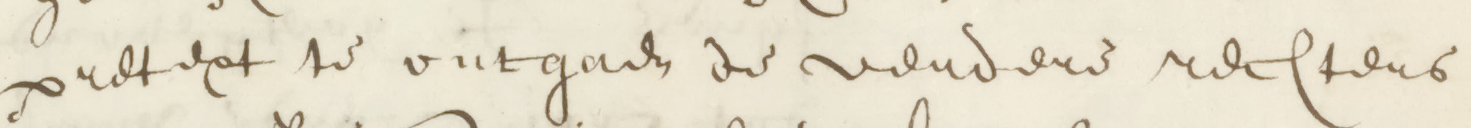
pretext te ontgaen de verdere rechters
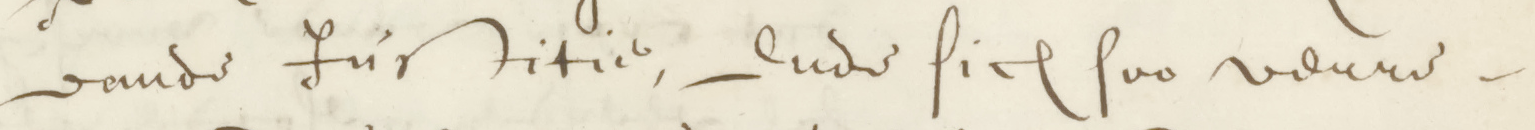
vande Justitie, ende sich soo verre -
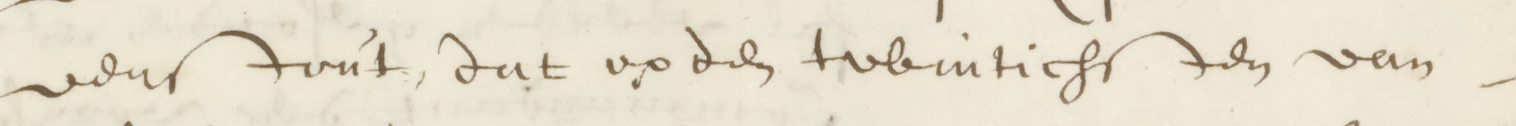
verstout, dat opden twintichsten van
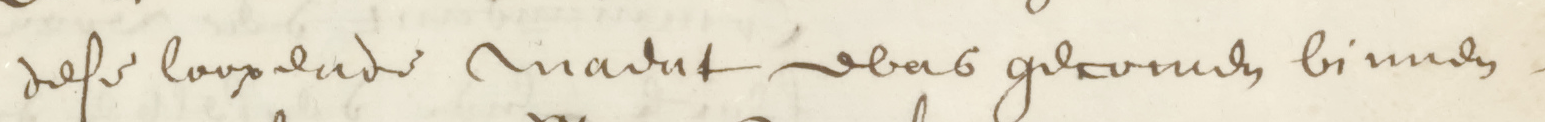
dese loopende maent was gecomen binnen
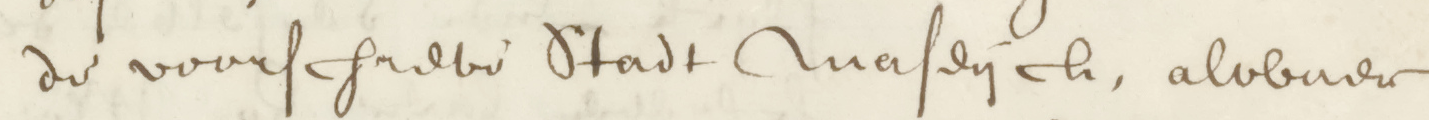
de voorschreve Stadt Maseijck, alwaer
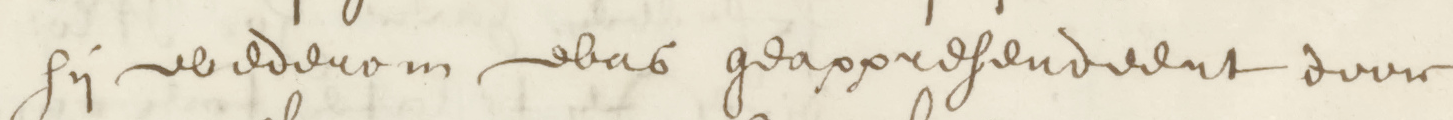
hij wederom was geapprehendeert door
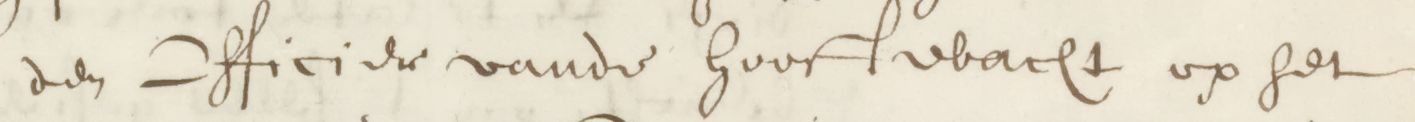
den Officier vande hooftwacht op het
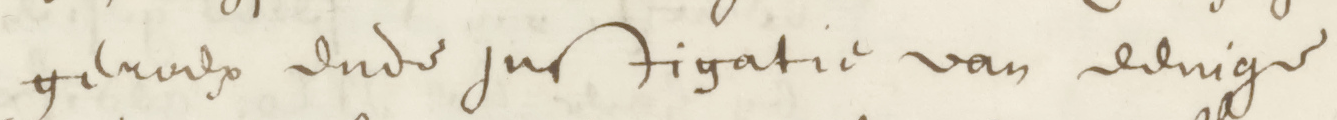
geroep ende instigatie van eenige
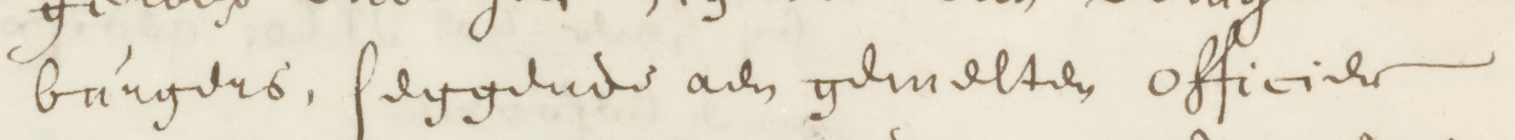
burgers, seggende aen gemelten officier
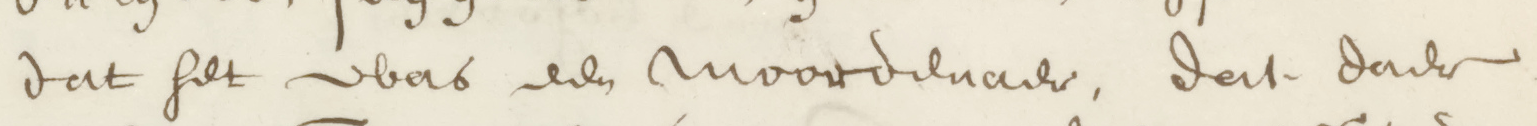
dat het was een moordenaer, dat daer
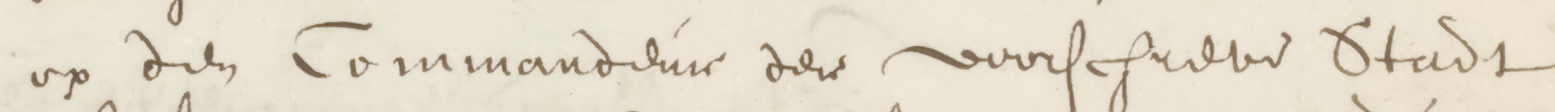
op den Commandeur der voorschreve Stadt
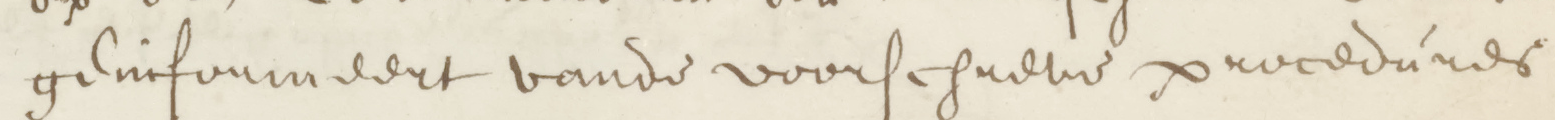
geinformeert vande voorschreve procedures
